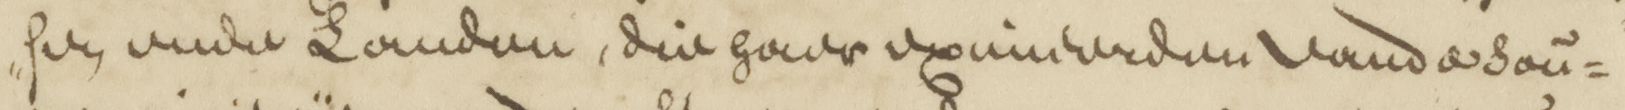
,,sen ende Landen, die haer exmineerden vande sou„
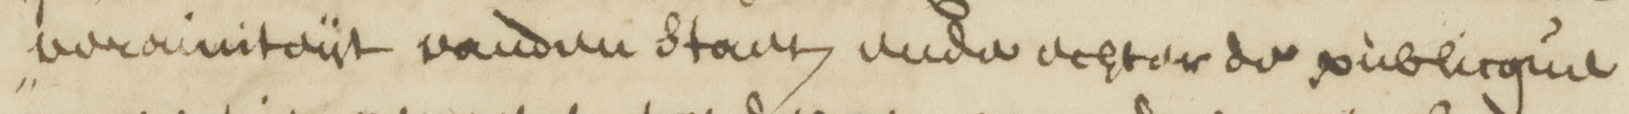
,,vereiniteijt vanden Staet, ende echter de publicque
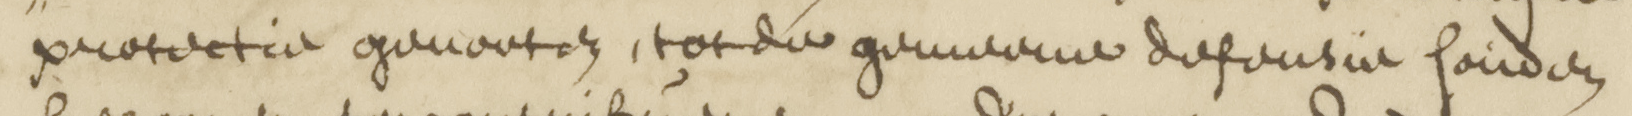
protectie genooten, tot de gemeene defensie souden
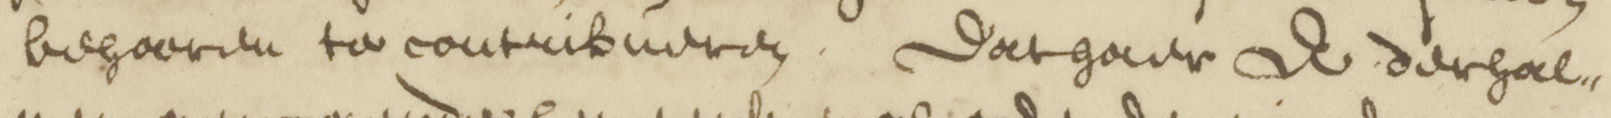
behoeren te contribueren. Dat haer E. derhal„
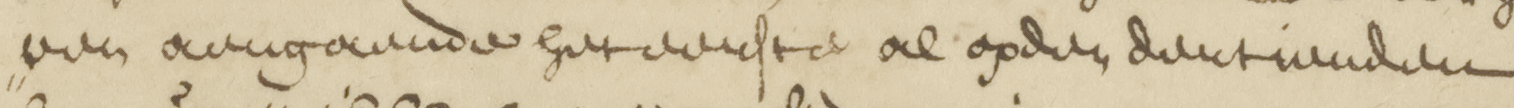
,,ven aengaende het eerste al opden dertienden
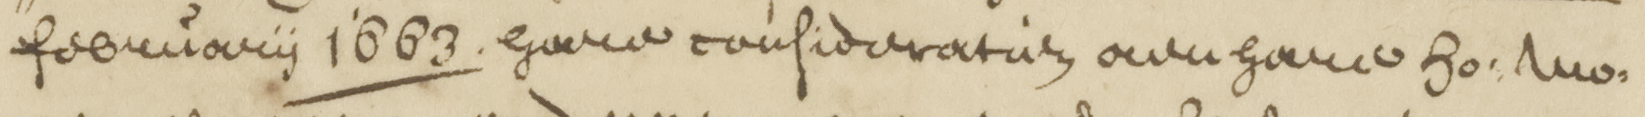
februarij 1663 hare consideratien aen hare Ho:Mo:
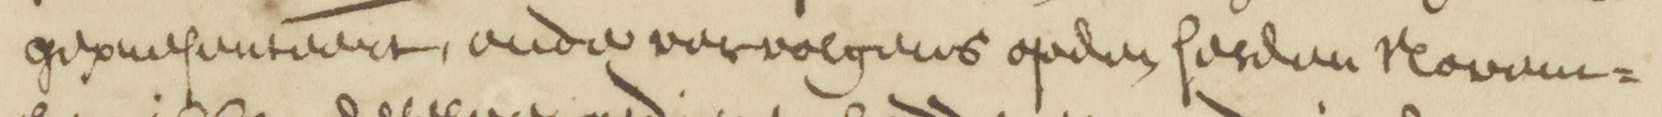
gepresenteert, ende vervolgens opden sesden Novem„
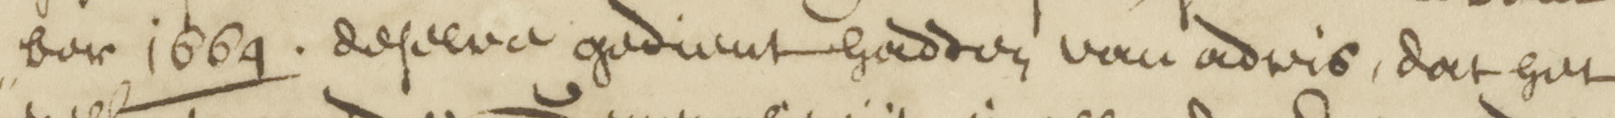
ber 1664. deselve gedient hadden van advis, dat het
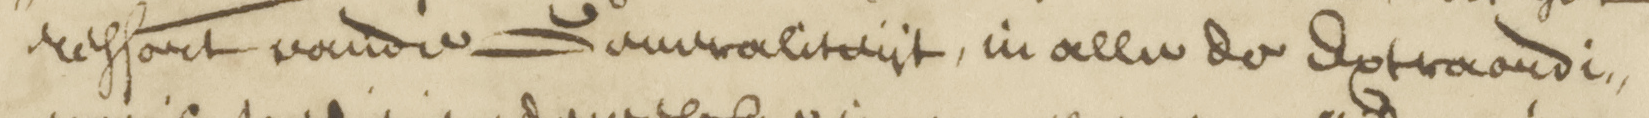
ressort vande Generaliteijt, in alle de Extraordi„
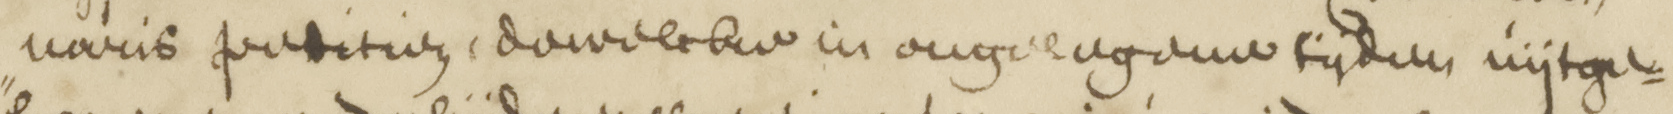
n,,aris petitien, dewelcke in ongelegene tijden uijtge„
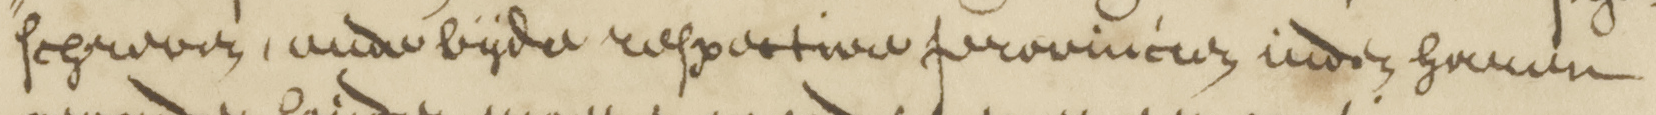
schreven, ende bijde respective provincien inden haren
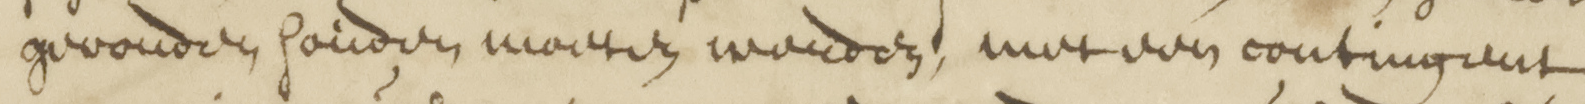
gevonden souden moeten werden, met een contingent
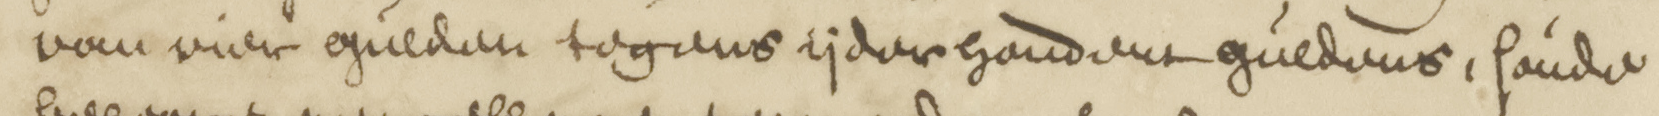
van vier gulden tegens ijder hondert guldens, soude
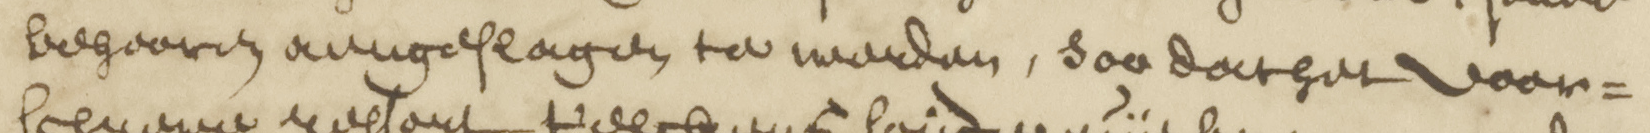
behooren aengeslagen te werden, soo dat het voor„
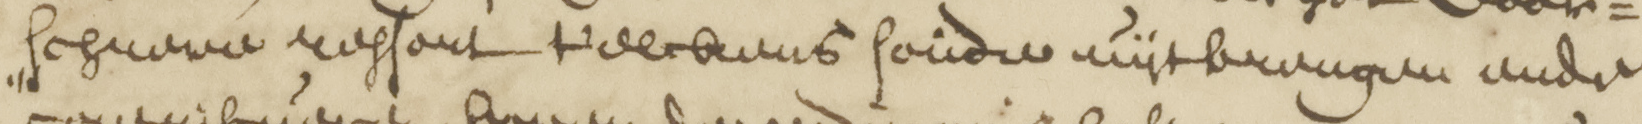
,,schreve ressort telckens soude uijtbrengen ende
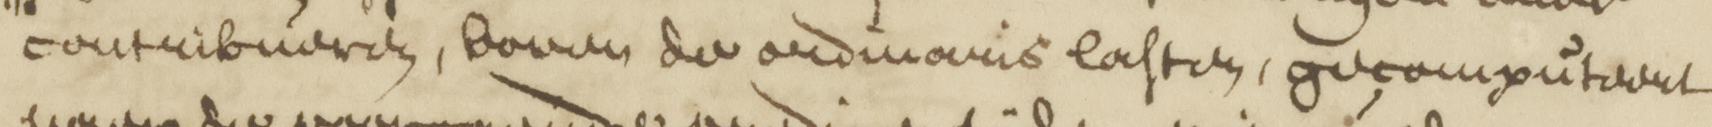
contribueren, boven de ordinaris lasten, gecomputeert
